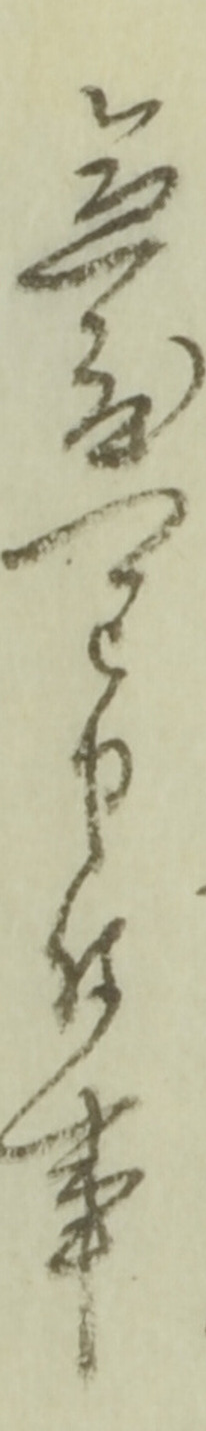急度可被申付事
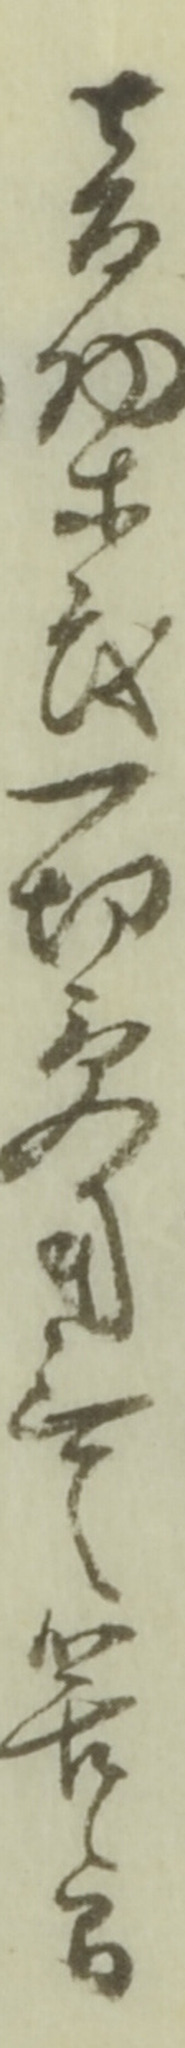音物等茂一切受用無之筈候間
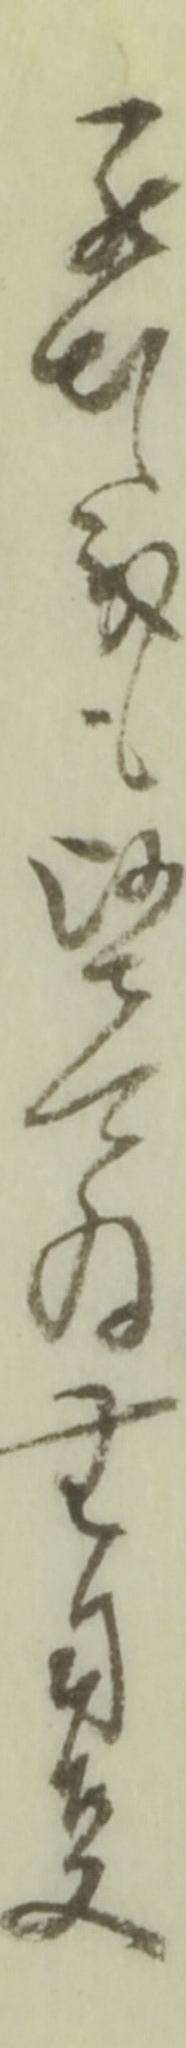罷出候義も改て可為無用事
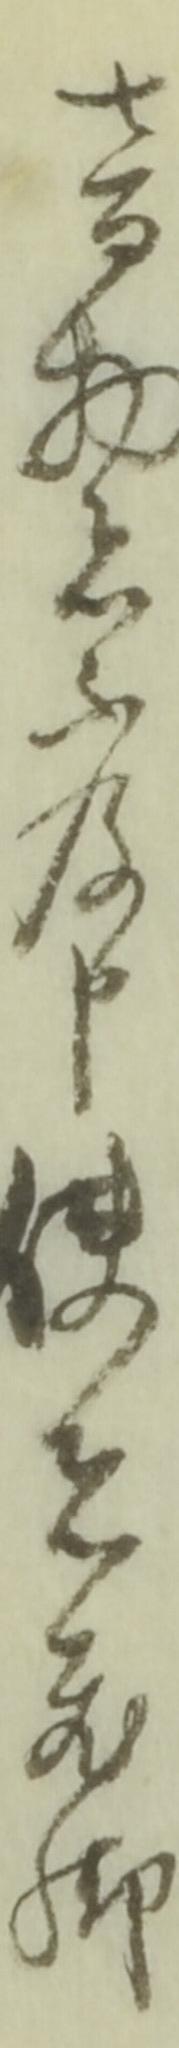音物者不及申使者飛脚
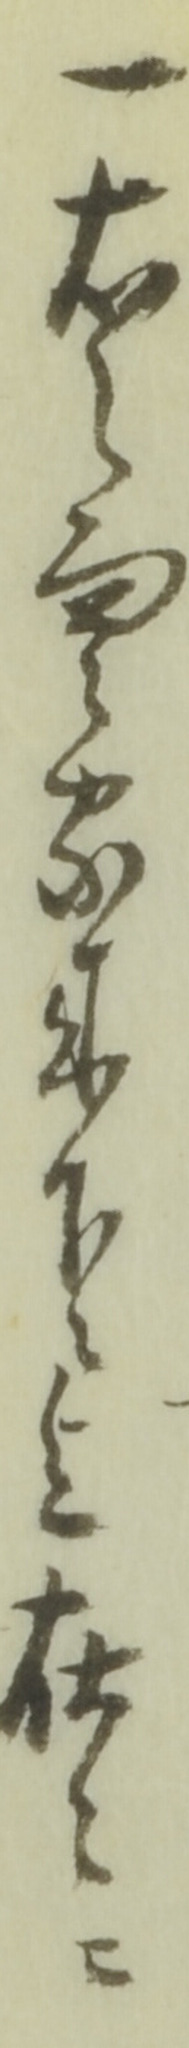一右之面々家来下々迄在々二
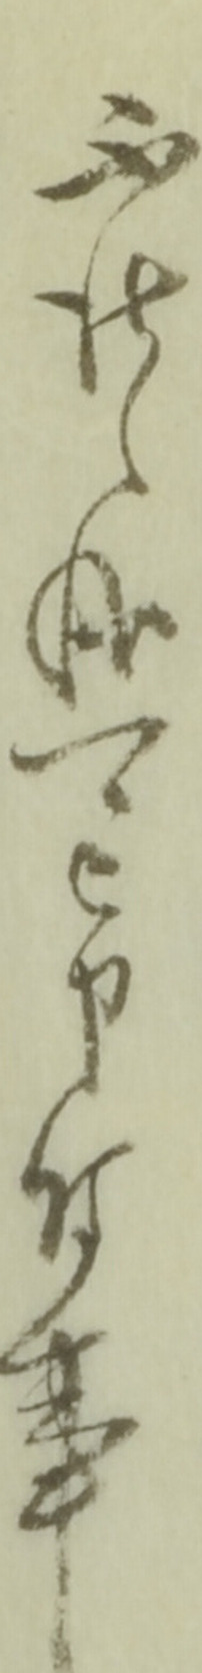不仕候様可被申付事
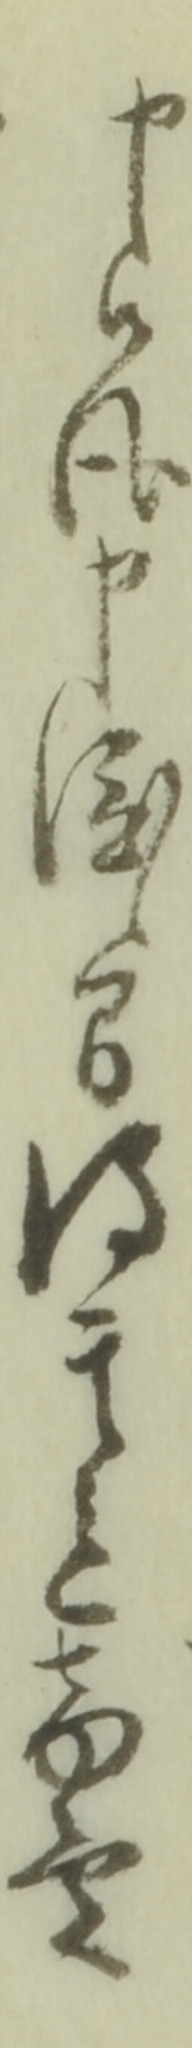申候様申渡候間得其意商売
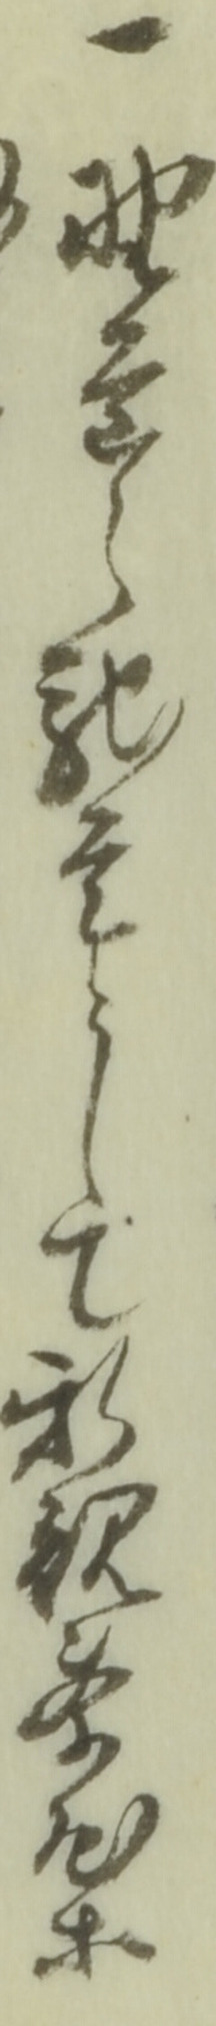一野臺之馳走として新観楽屋等
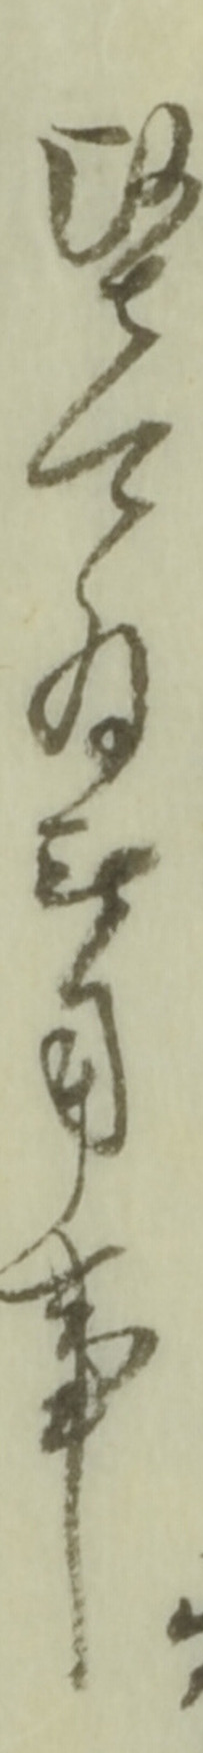堅可為無用事
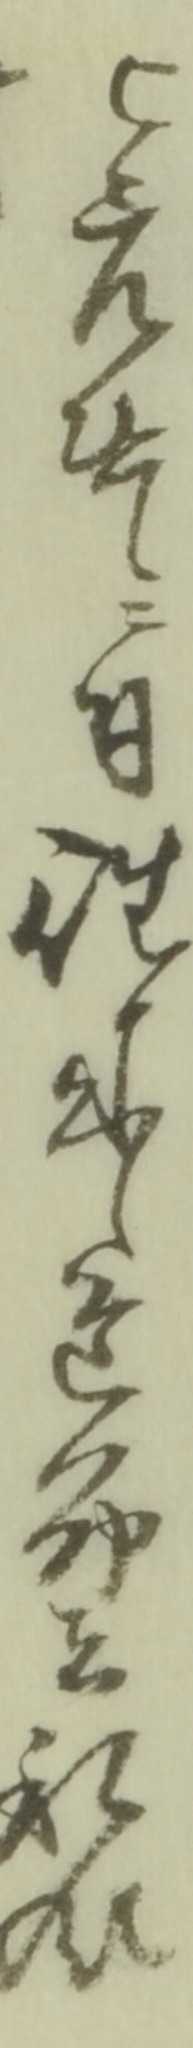被差出候二付く往来候道筋者私領
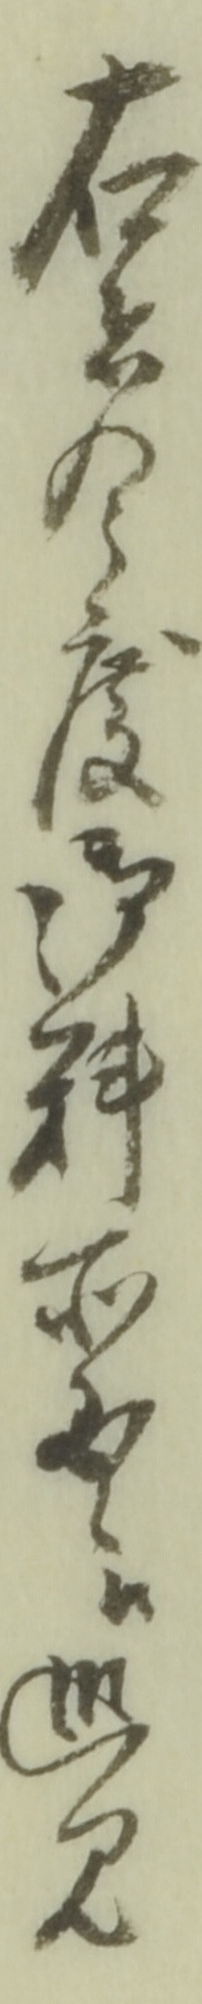右者今度御料所辺りえ巡見
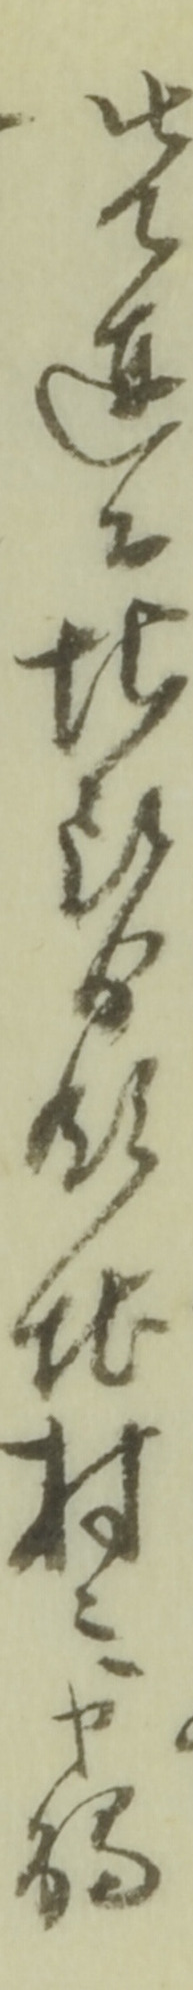先達而北頭より領他村々二申触
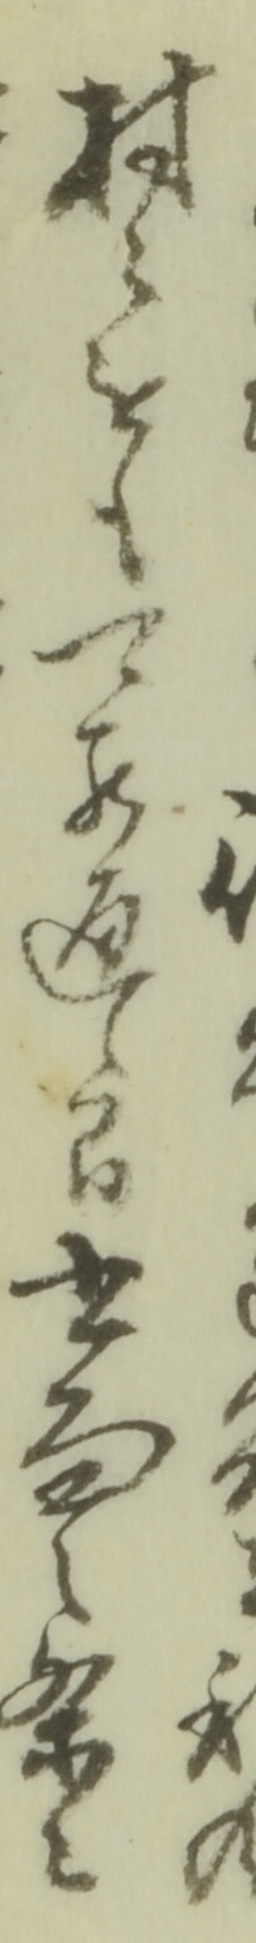村々をも可相通候間書面之条二
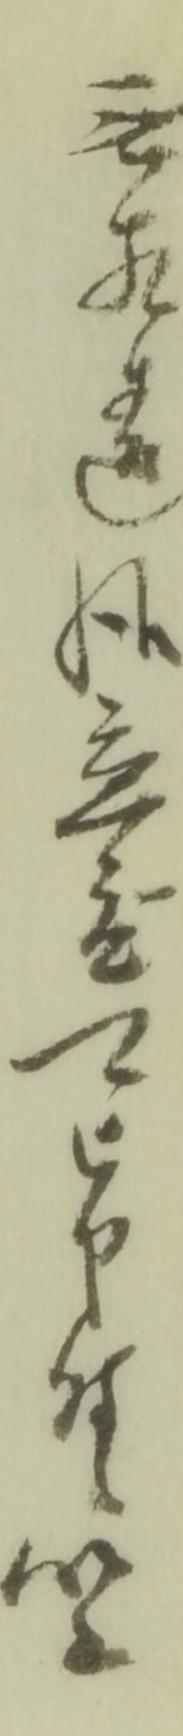無相違様急度可被申付候以上
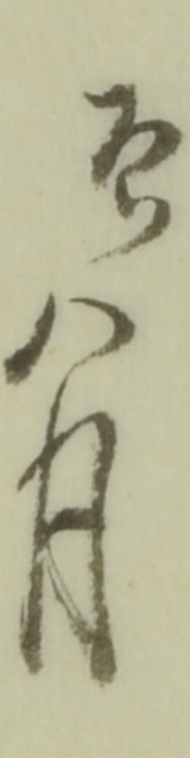辰八月
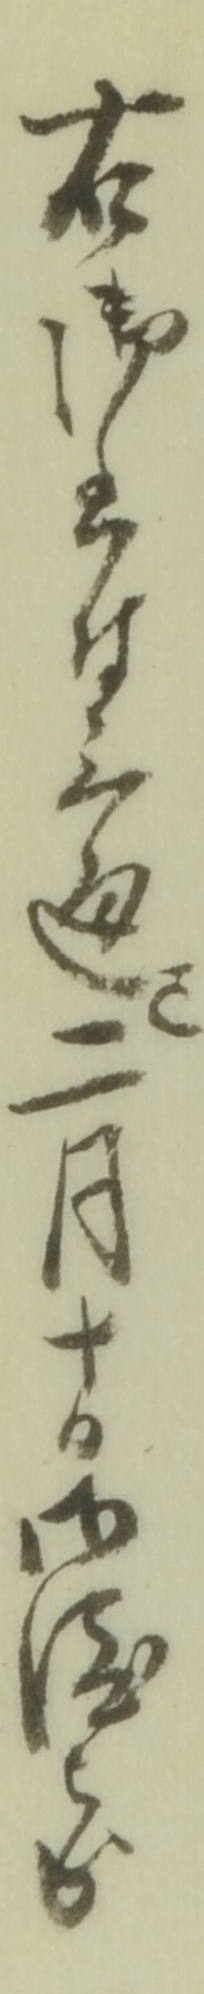右御書付之通己二月十日御渡被出
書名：御公儀様御領主様御触書控
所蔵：伊那市立高遠町図書館・合同会社AMANE
